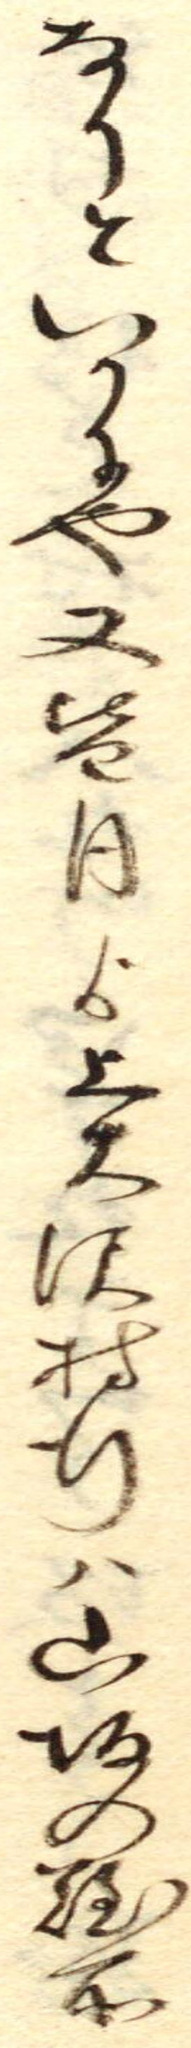なりといかにや又皆月ゟ上大沢村行は山坂の難所
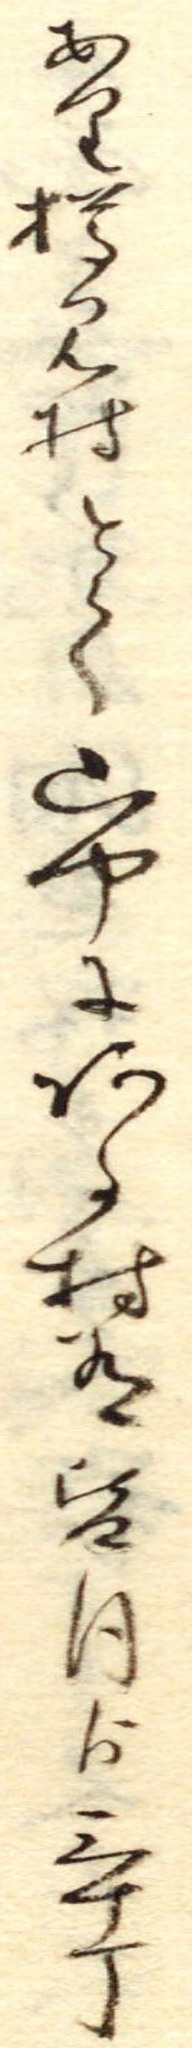あり樽見村とて山中にある村有皆月ゟ三十丁
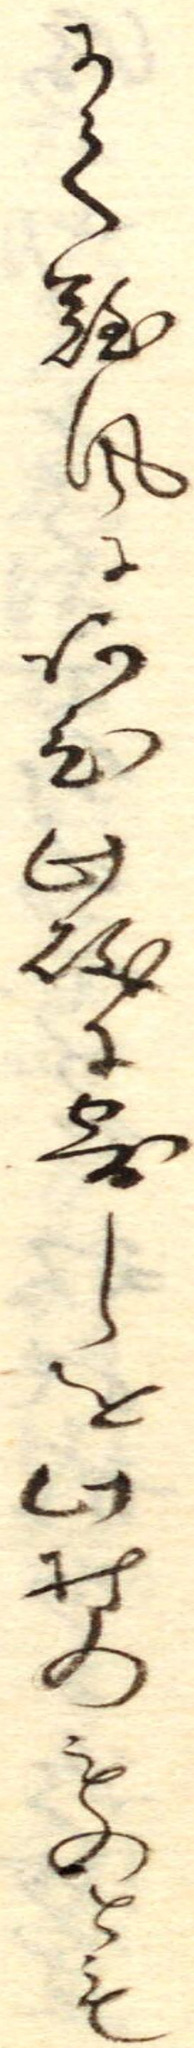にて難風にあひ此礒に寄しを此村のものとも
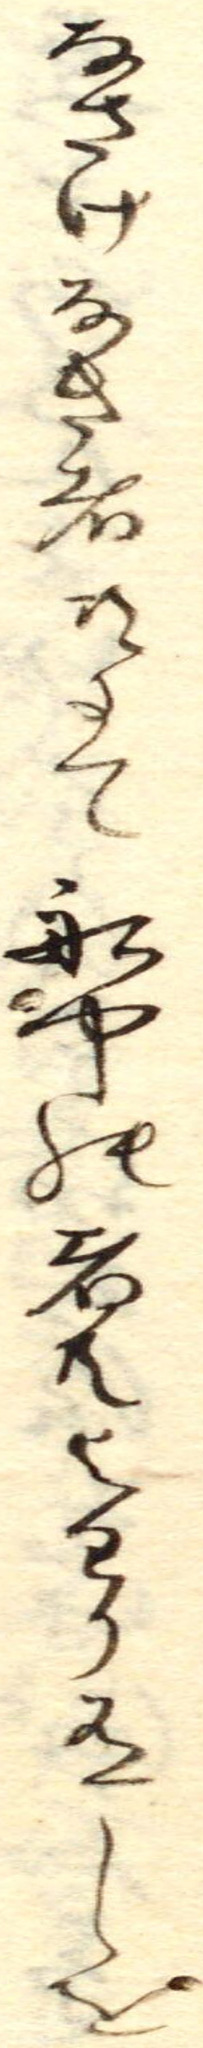情けなさけなき者共にて船中の者共よわり有しを
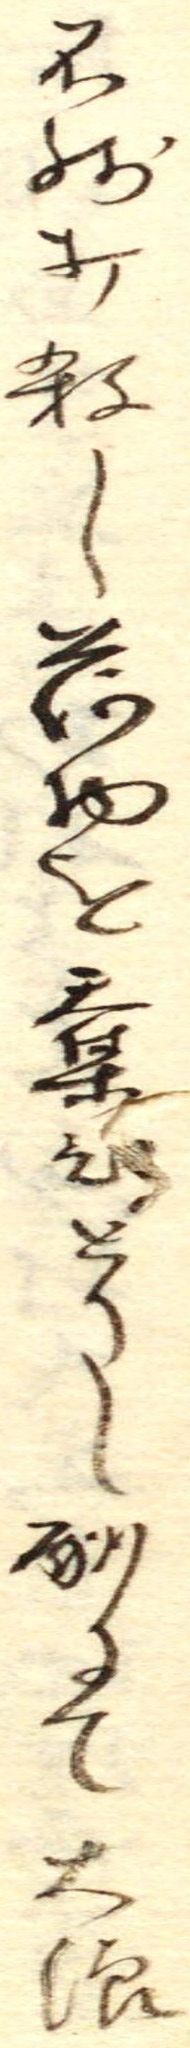不残打殺し荷物を奪ひとりし酬にて大浪
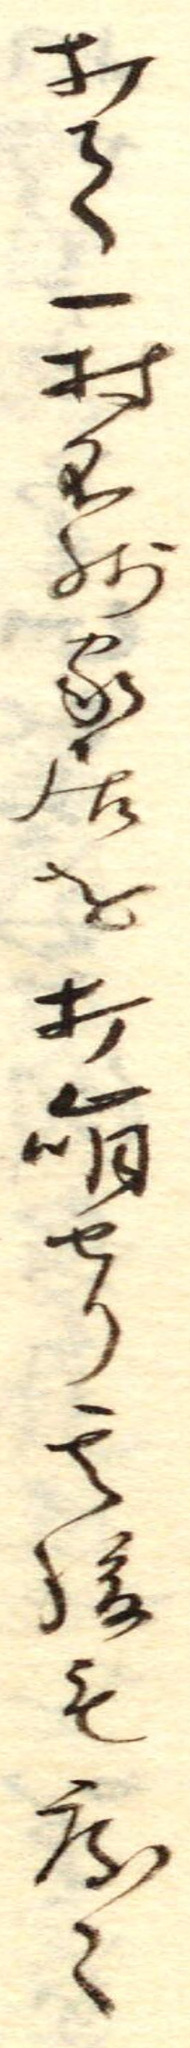打て一村不残家居を打崩せり其後も度々
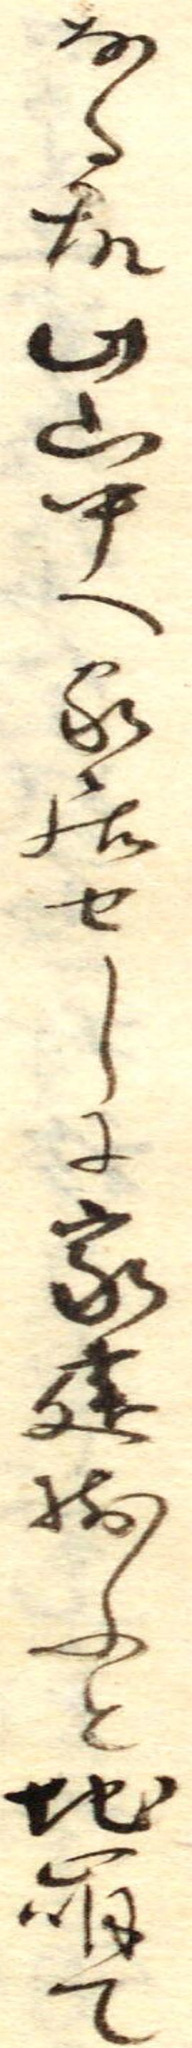なる故此山中へ家居せしに家建揃ふと地崩て
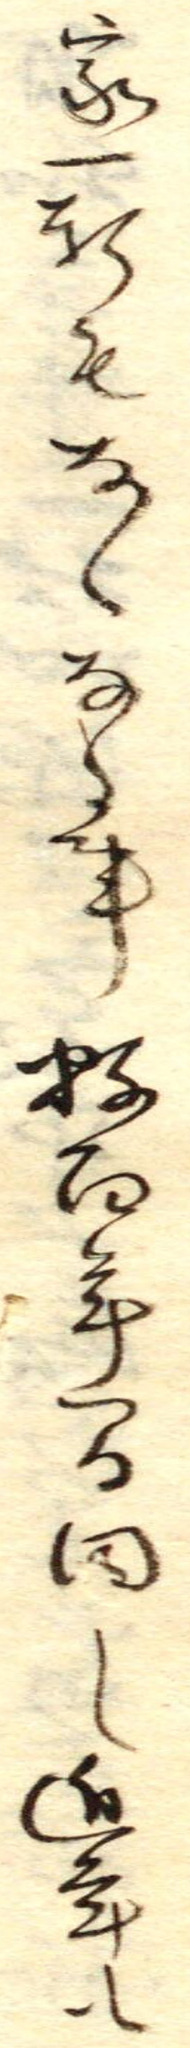家一軒もなくなる事数百年間同し近年も

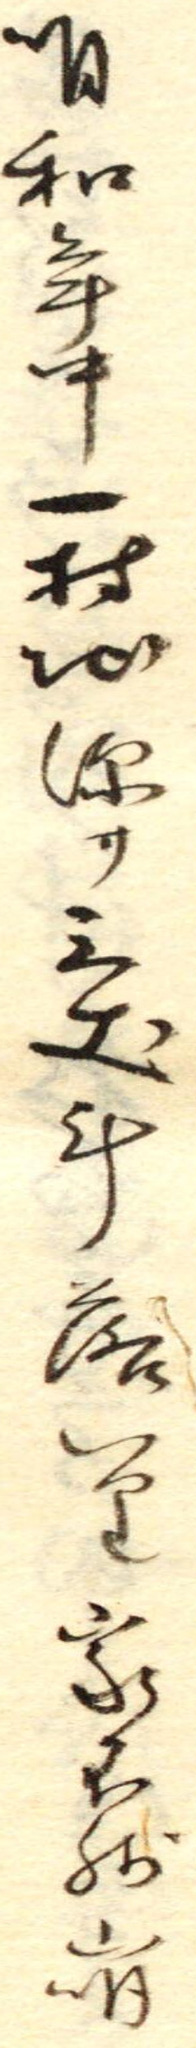明和年中一村地深さ三丈計落いり家不残崩
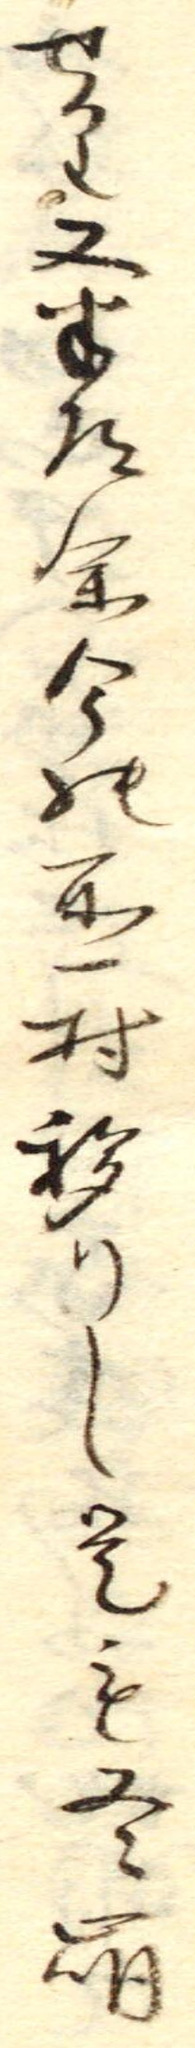せり又半道余今の所一村移りし是も又々崩
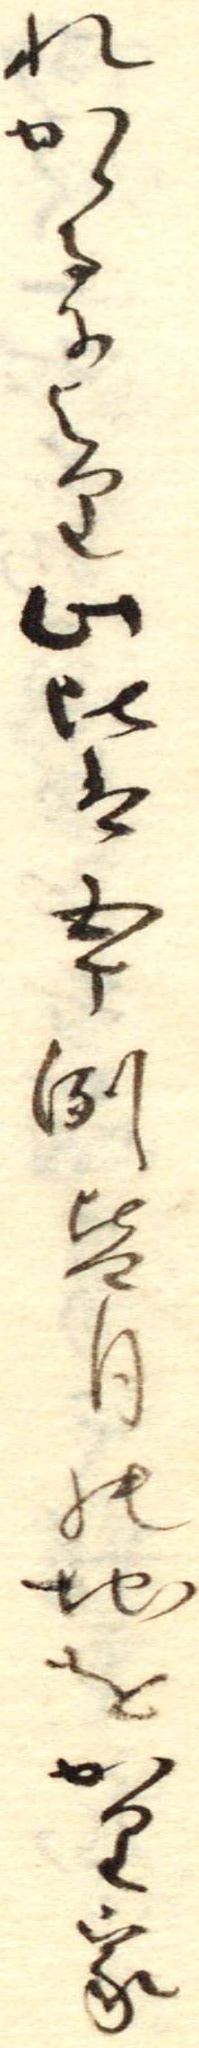れかゝるにより此比は五十洲皆月の地をかり家
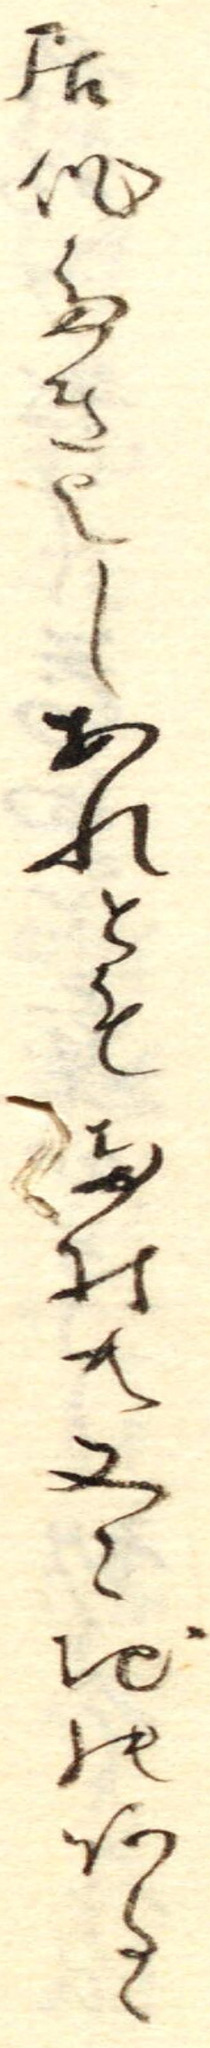居作たきよしあれとも両村共又々地のあるゝ
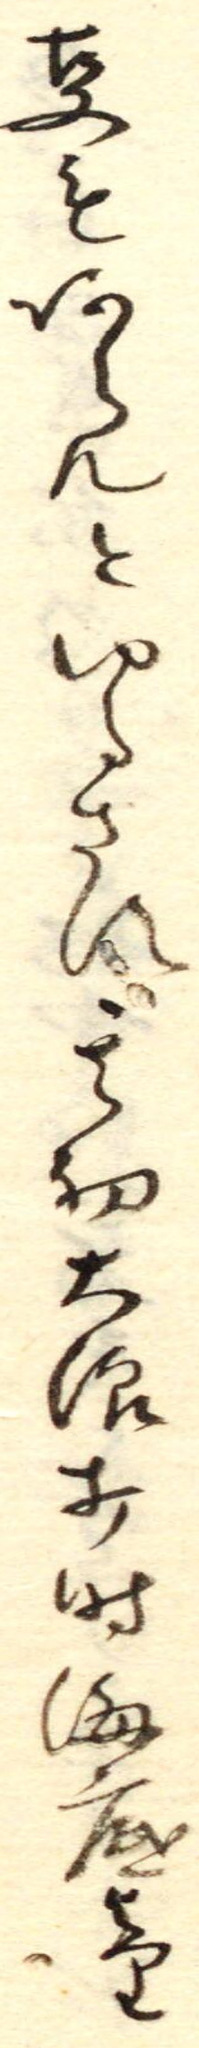事もあらんとゆるさす其初大浪打時海底より
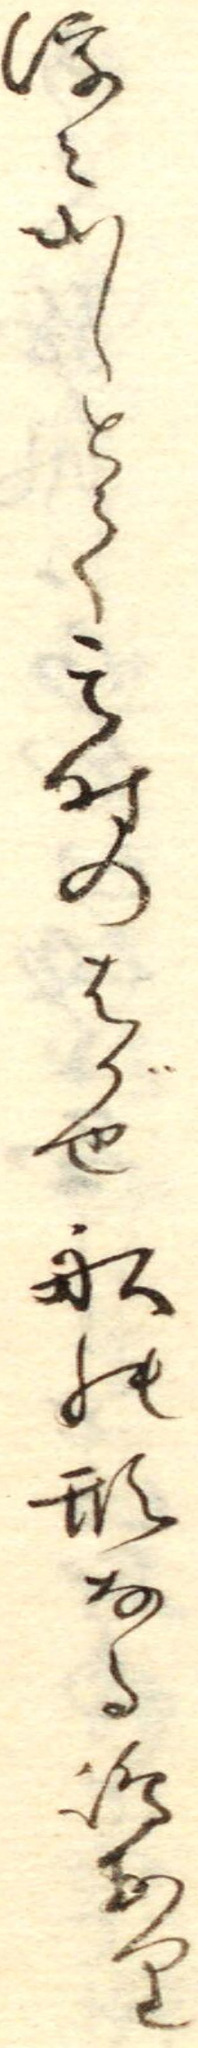浮之出しとて其時のはがせ船の形なる嶋あり
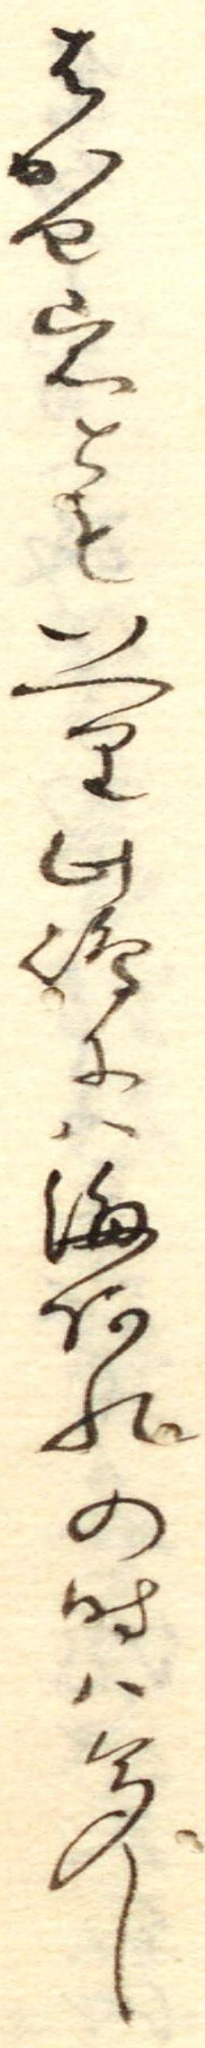はかせ岩ともいへり此嶋には海あれの時は多し
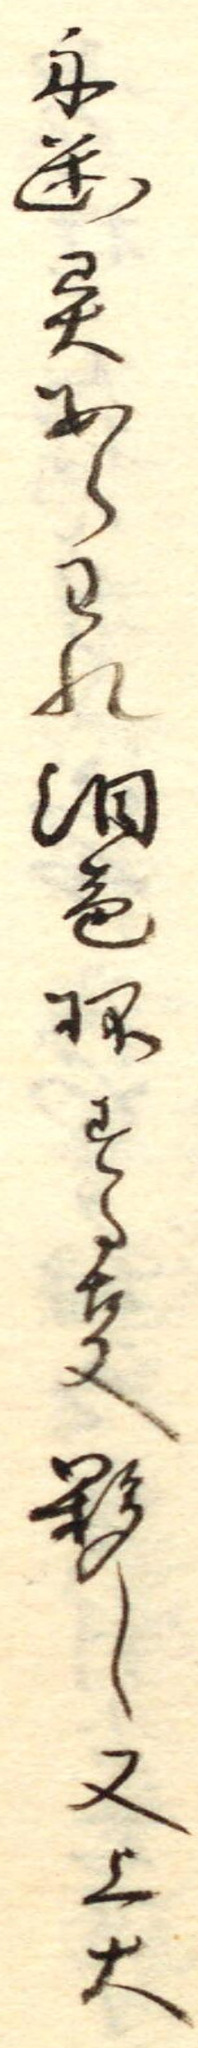舟迷霊あらわれ泪声抔する事夥し又上大
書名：能登名跡誌
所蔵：Ishikawa Prefectural Library
